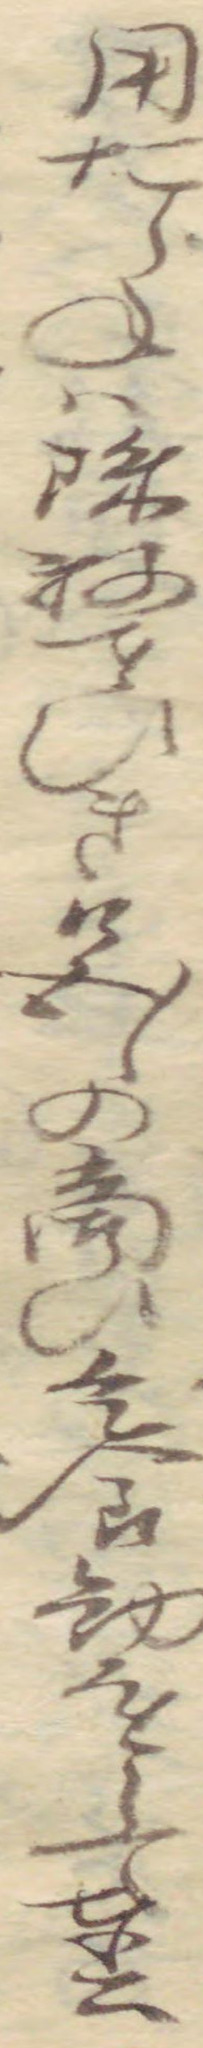用たらねは珠数をひき色〳〵の商ひ乞食勧進して奉公
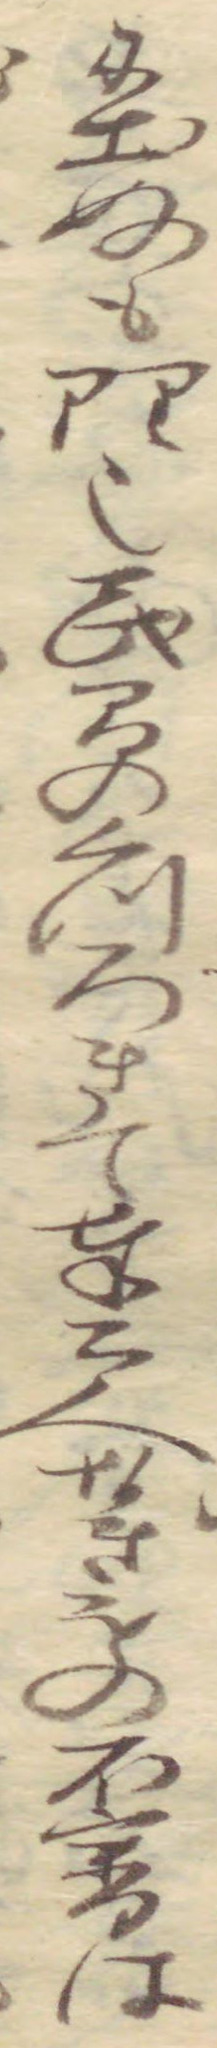に出ぬも理也民間のくつろきて奉公人なきもの不審は
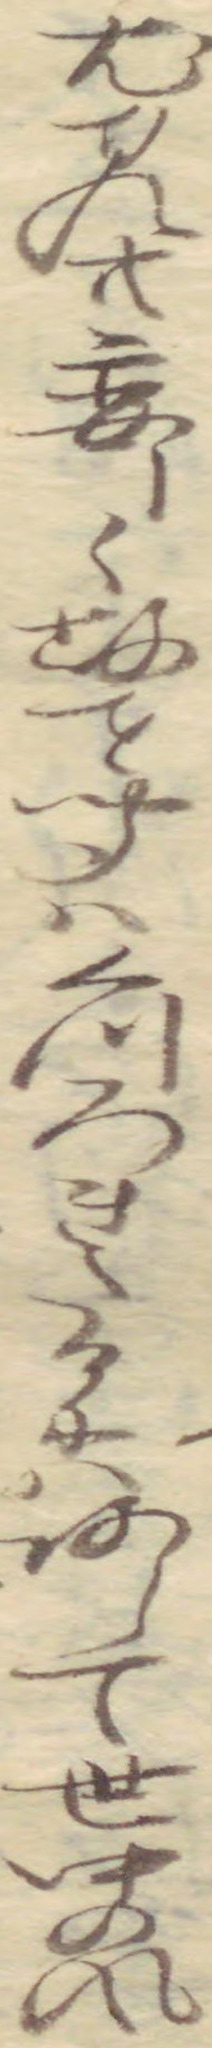尤なれ共委しく故を聞はくつろきたるにはあらて世中の風
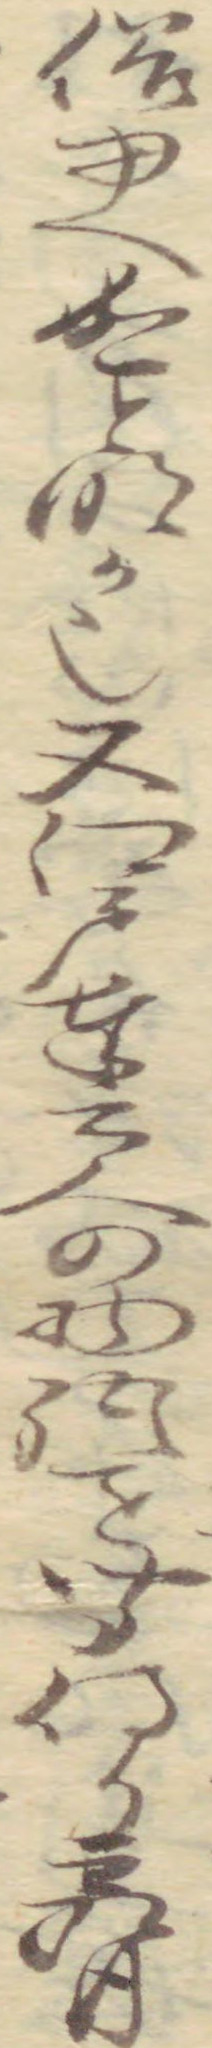俗ゆへ成こと明か也又江戸奉公人の物語を聞侍り霜月
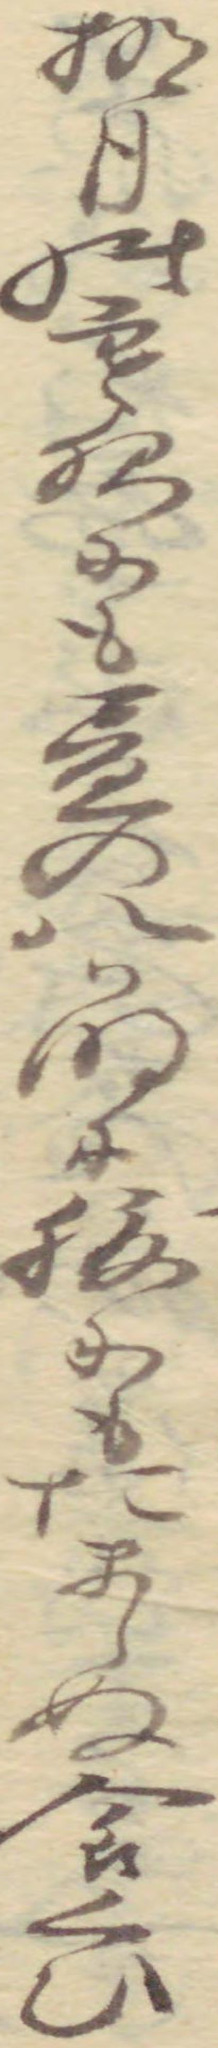極月の寒夜にも昼の八ツ時に腹にもたまらぬ食くひ
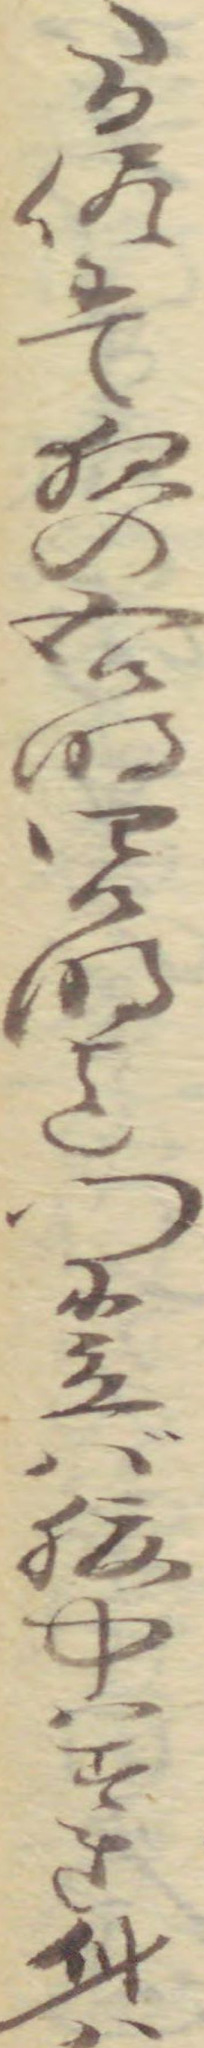たる侭にて夜の五ツ時四ツ時迄門に立ば腹中はすき身は
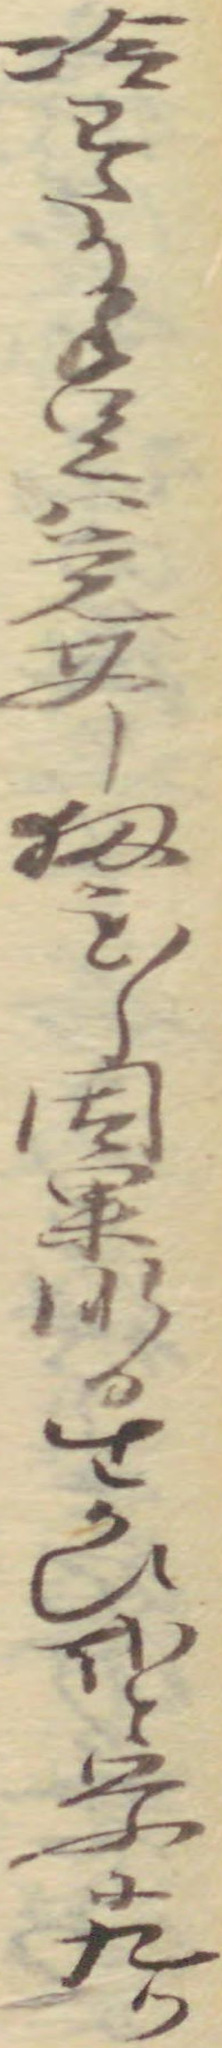冷わたり手足は覚なし扨も〳〵因果なる生かひ哉と思ふに九ツ
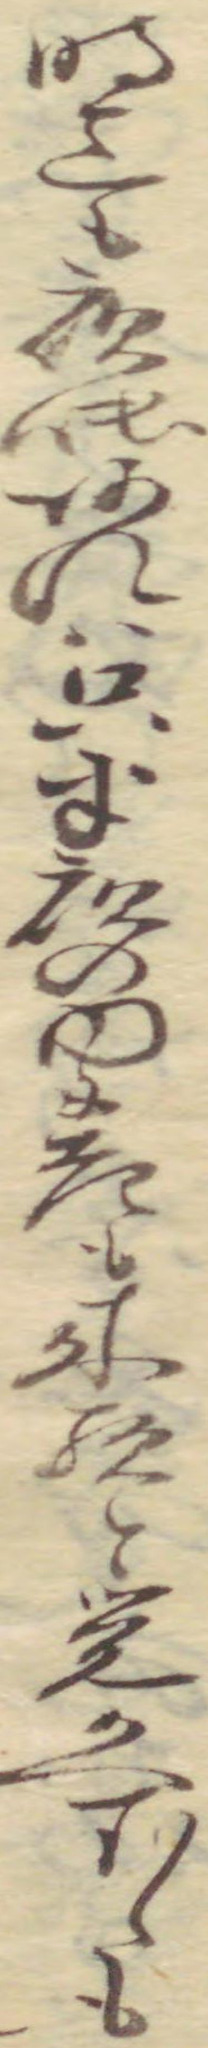時迄も夜咄あれは唯半夜の内に老も来歟と覚かへす〳〵も
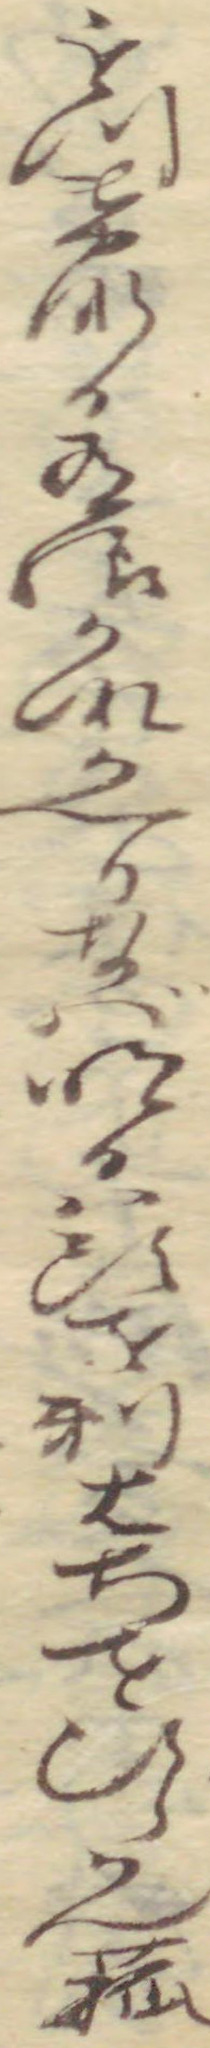もつけなる有様かなかへりなば明日は頭を剃はちをひらかん菰
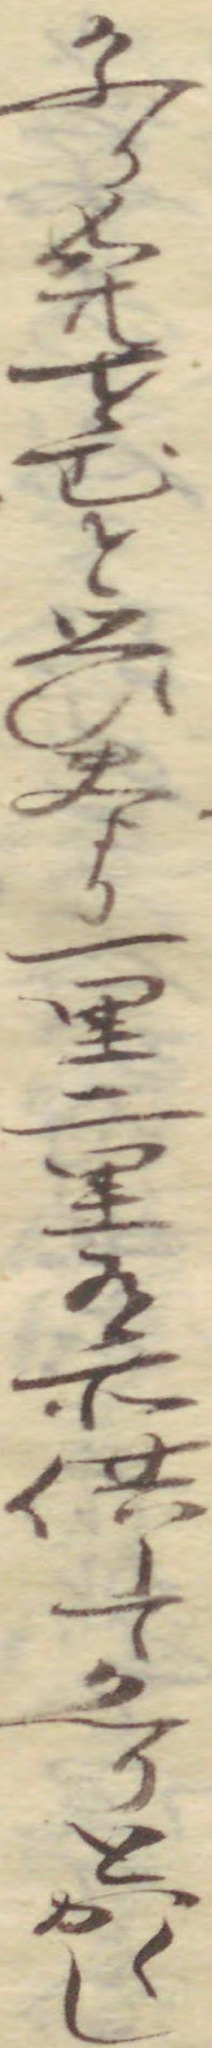かふり成共せむと思ひ夫より一里二里有所供してかへりとかくし
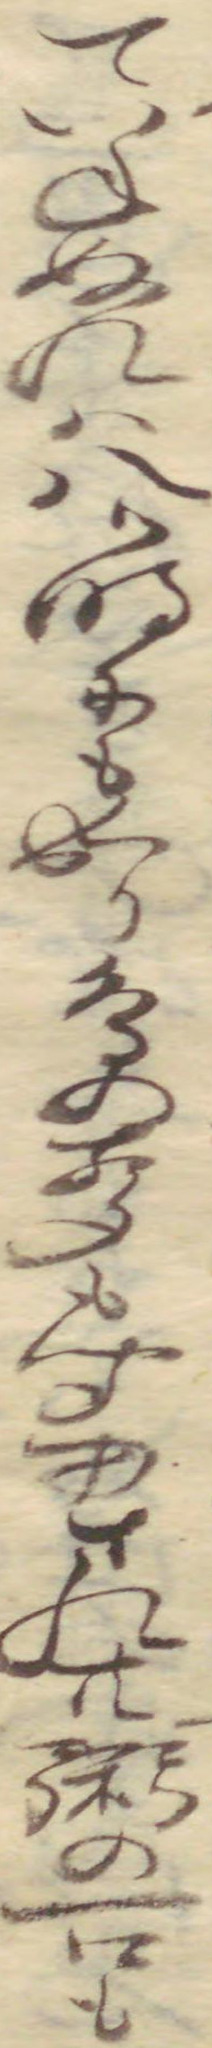ていねぬれは八ツ時にも成り鳥の声も聞ゆされ共粥の一口も
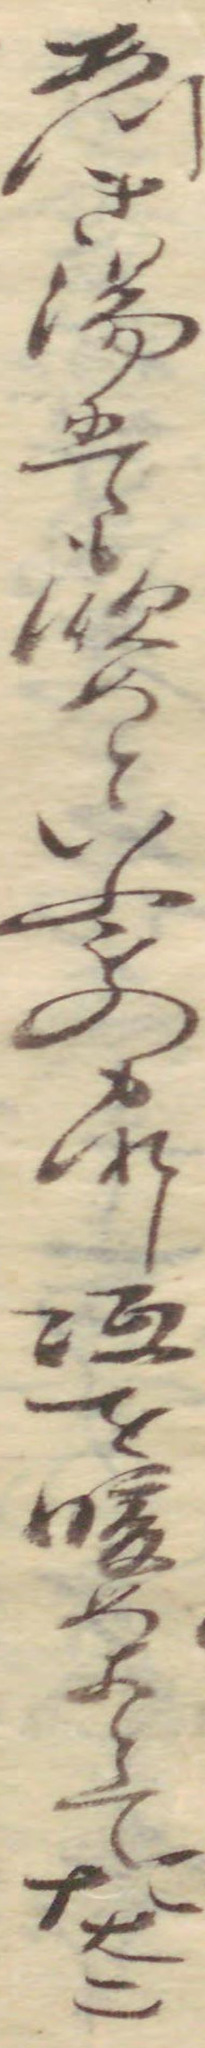あつき湯にても飲めといふものもなし凍を暖めよとてたはこ
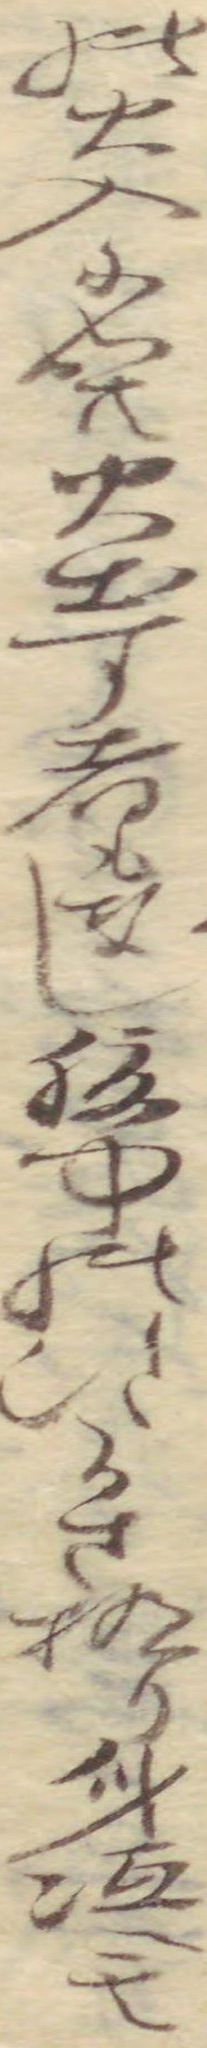の火入に成共火出す者もなし腹中のひたるさ極り身凍へ其
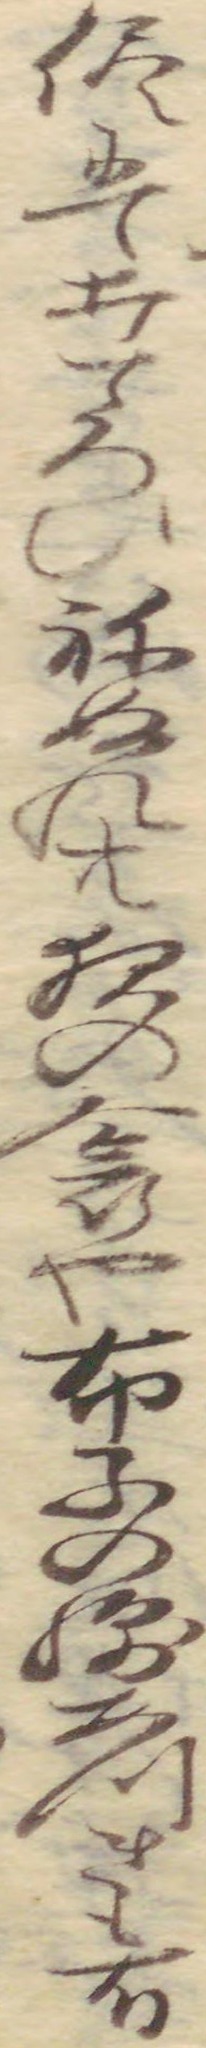侭にて打ころひねぬれ共夜の衾や布子の綿あつきも有
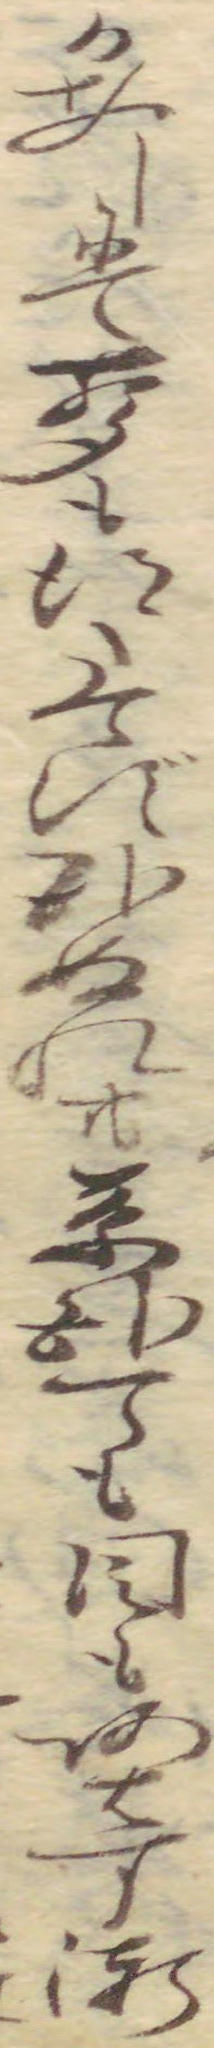かなしにて声も得たてず臥ぬれ共草臥ても目もあはす漸
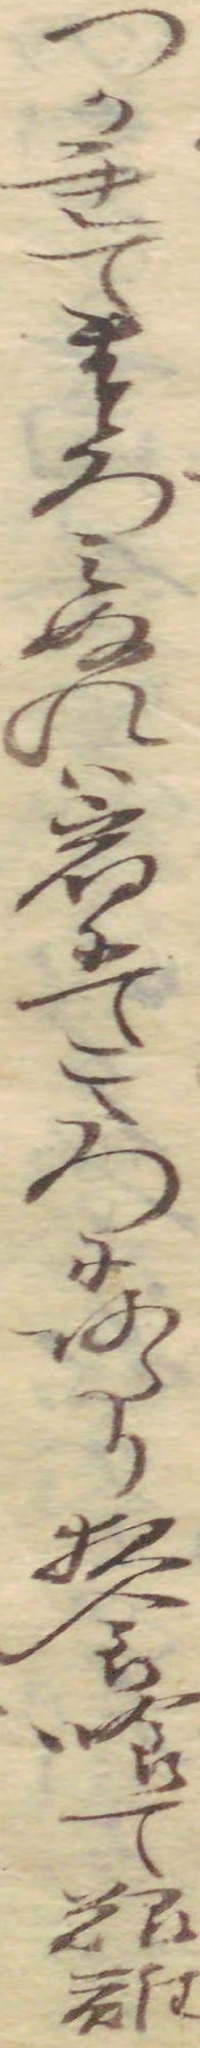つかれてまとろみぬれは宿にてこたつにあたり夜食喰て艱難
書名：鶯宿雑記. 巻263-264
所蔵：国立国会図書館 National Diet Library, JAPAN
